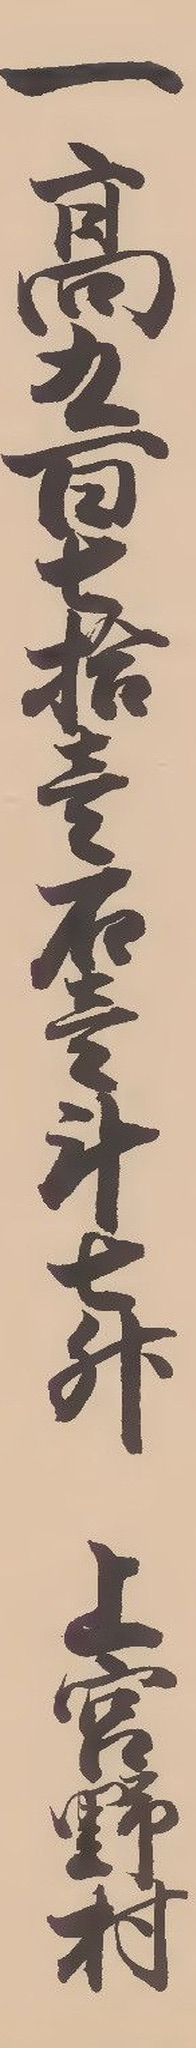一高九百七拾壱石壱斗七升上宮野村

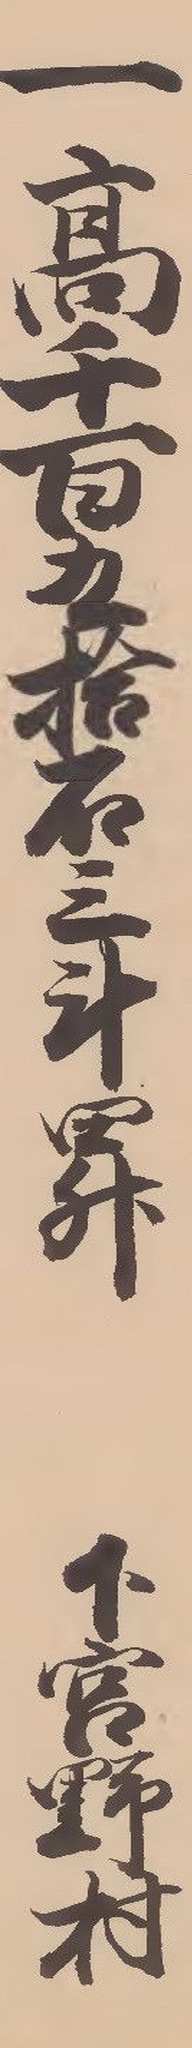一高千百九拾石三斗四升下宮野村
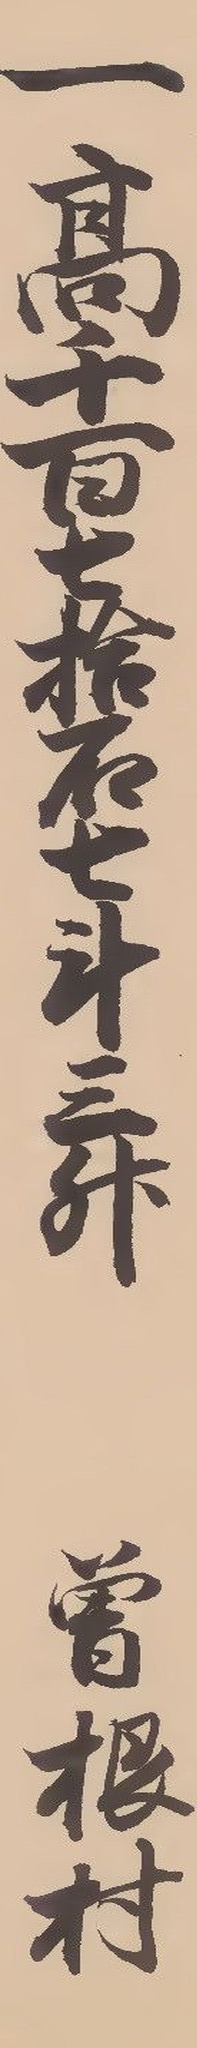一高千百七拾石七斗三升曽根村
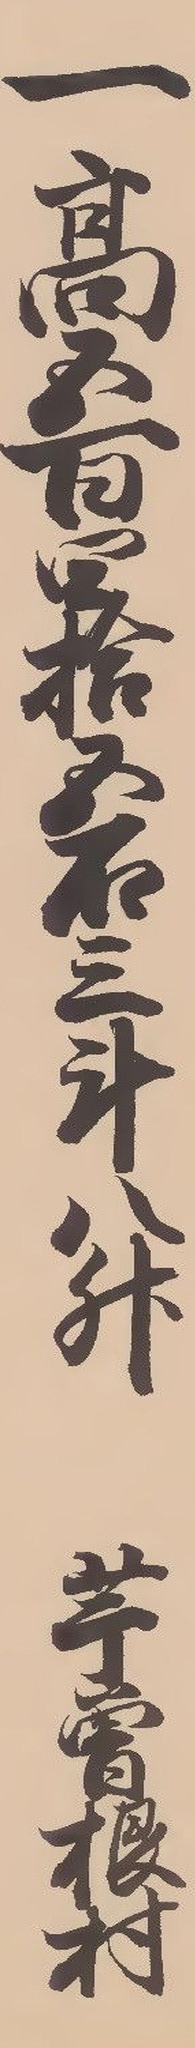一高五百四拾五石三斗八升芋曽根村
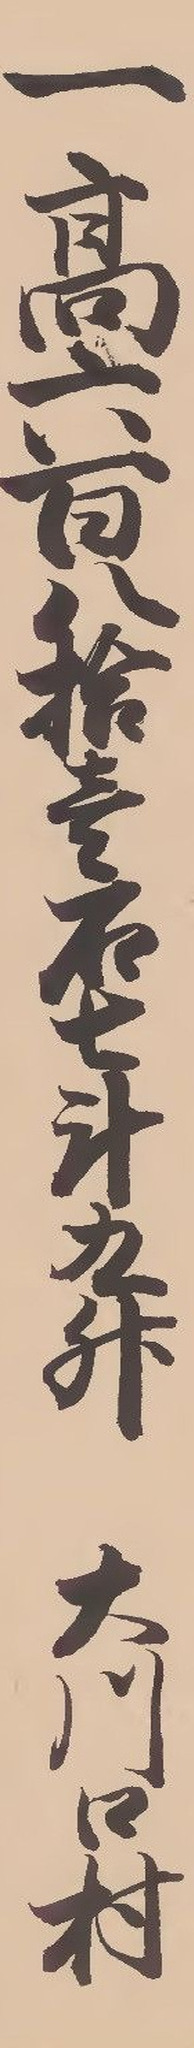一高六百八拾壱石七斗九升大川口村
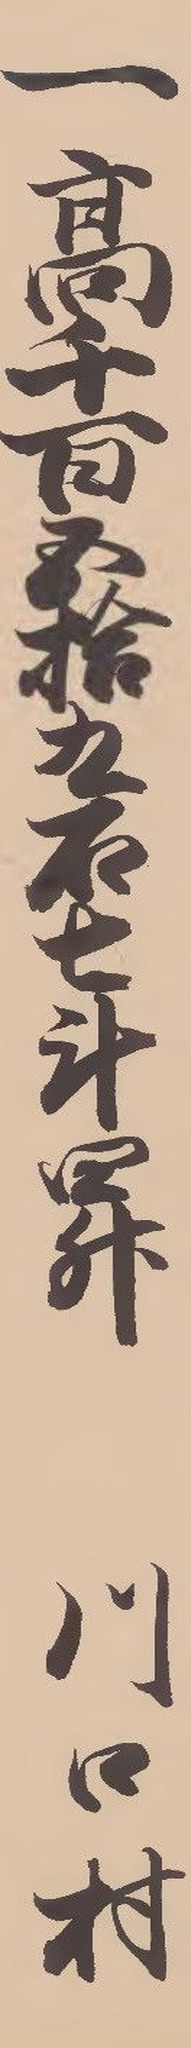一高千百五拾九石七斗四升川口村
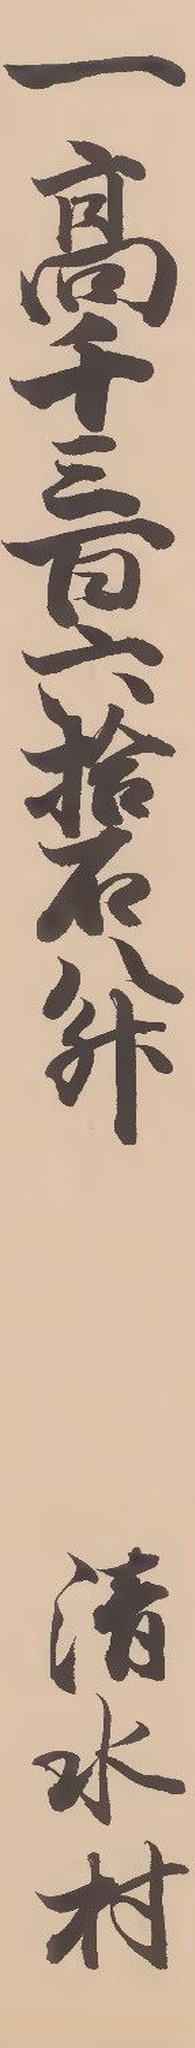一高千三百六拾石八升清水村
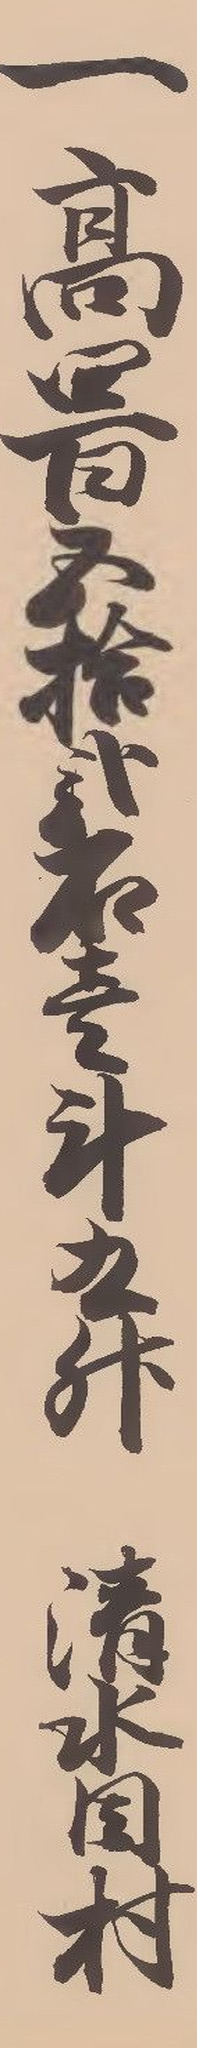一高四百五拾弐石壱斗九升清水目村
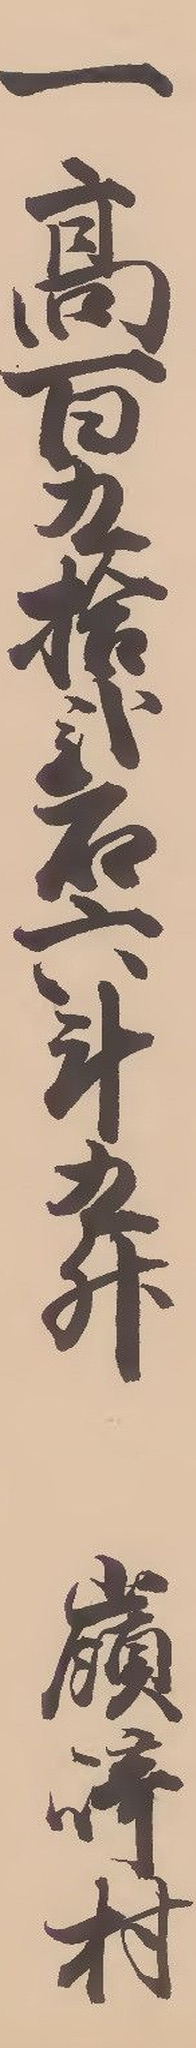一高百九拾弐石六斗九升嶺崎村

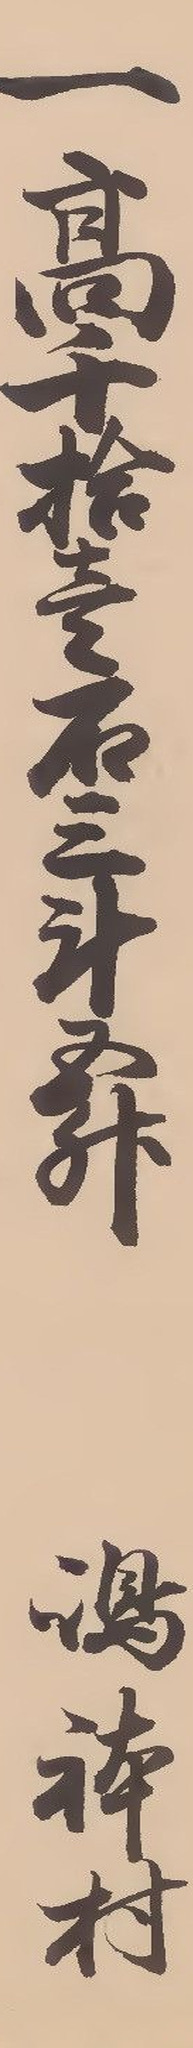一高千拾壱石三斗五升島体村
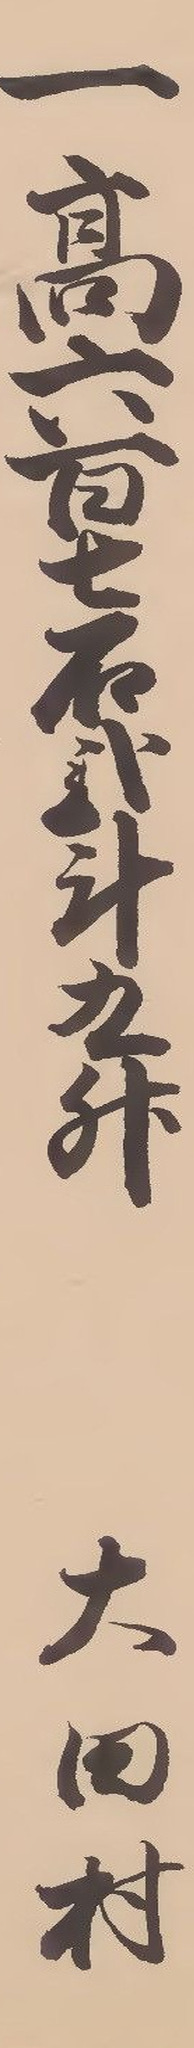一高六百七石弐斗九升大田村
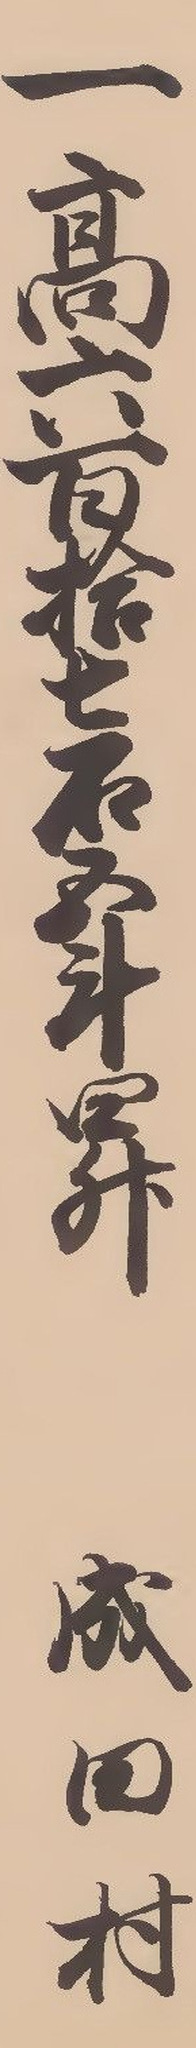一高六百拾七石五斗四升成田村
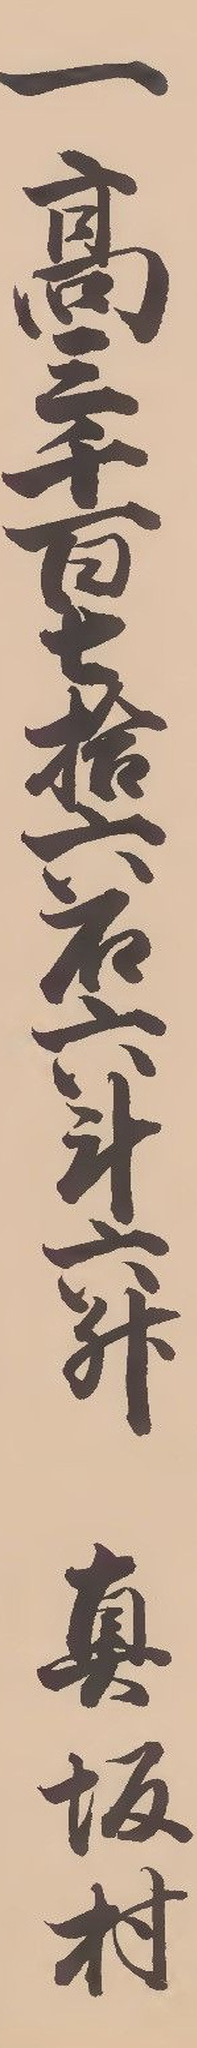一高三千百七拾六石六斗六升真坂村
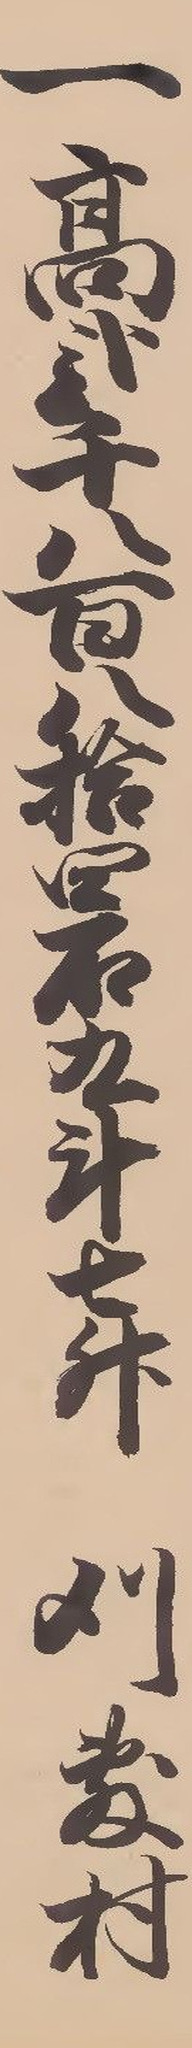一高弐千八百八拾四石九斗七升刈敷村
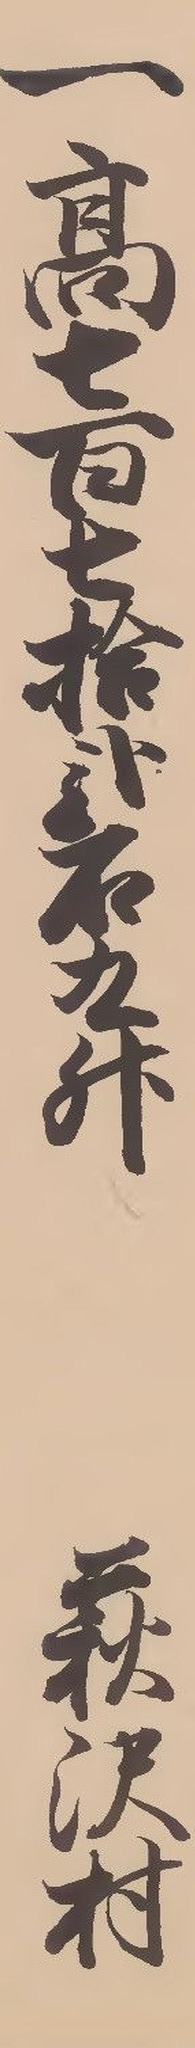一高七百七拾弐石九升萩沢村
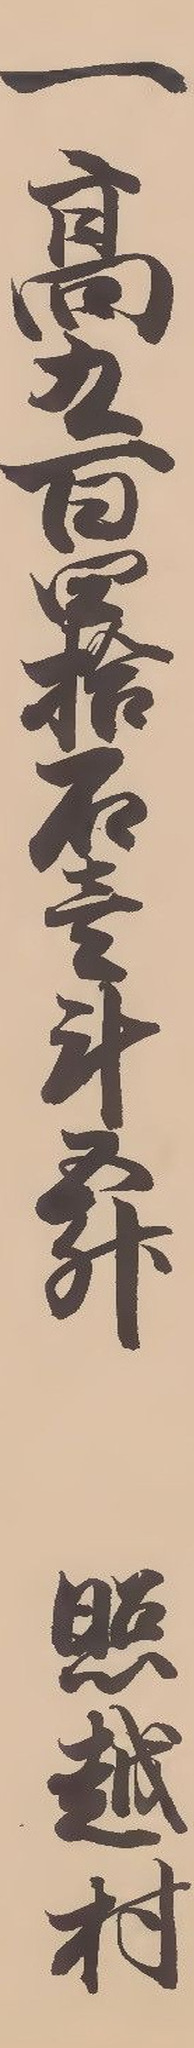一高九百四拾石壱斗五升照越村
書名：陸奥国郷帳　５
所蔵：国立公文書館 National Archives of Japan
